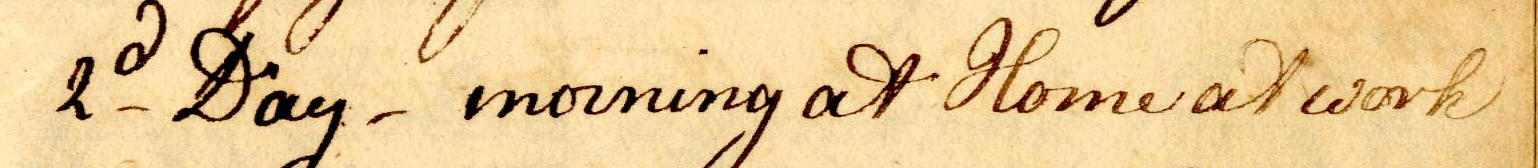2^d Day - morning at Home at work
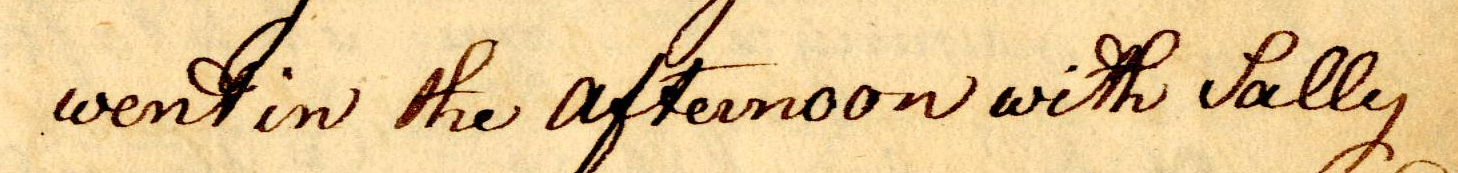went in the Afternoon with Sally
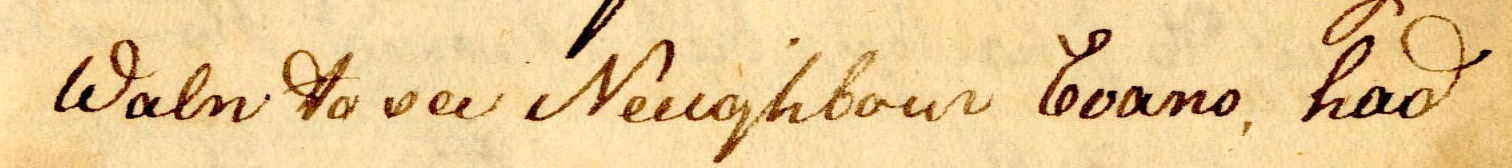Waln to see Neighbour Evans, had
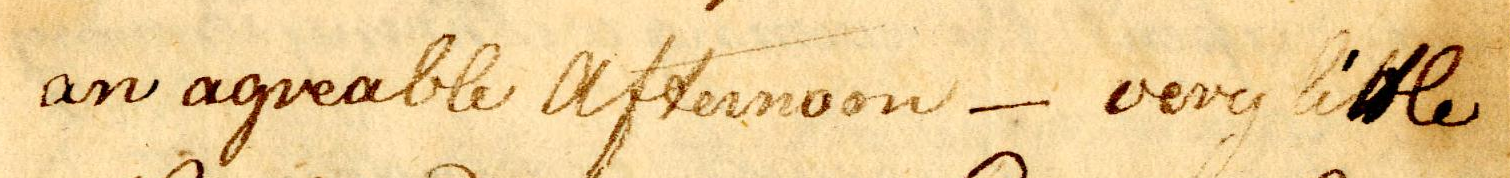an agreable Afternoon- very little
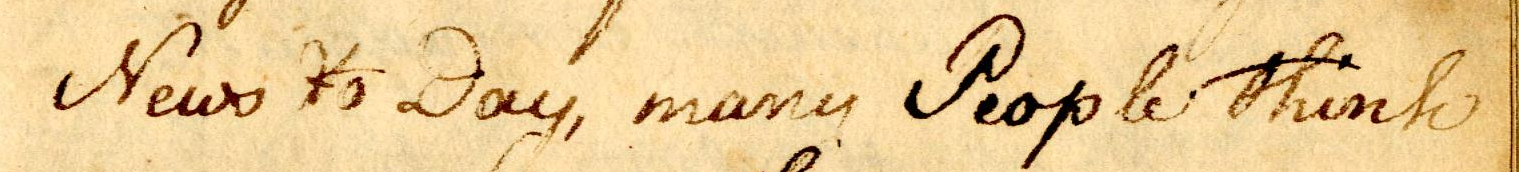New to Day, many People think
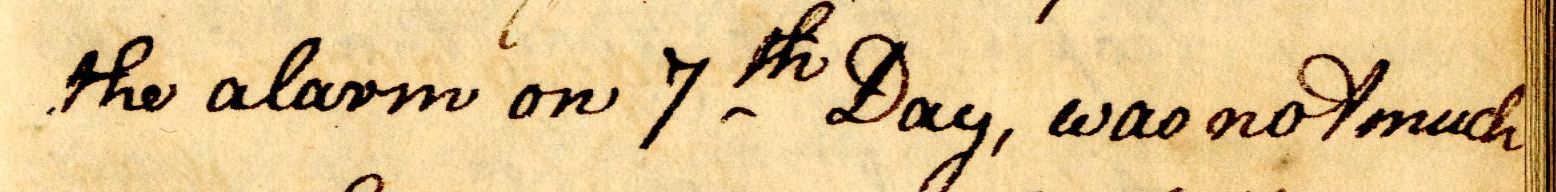the alarm on 7^th Day, was not much
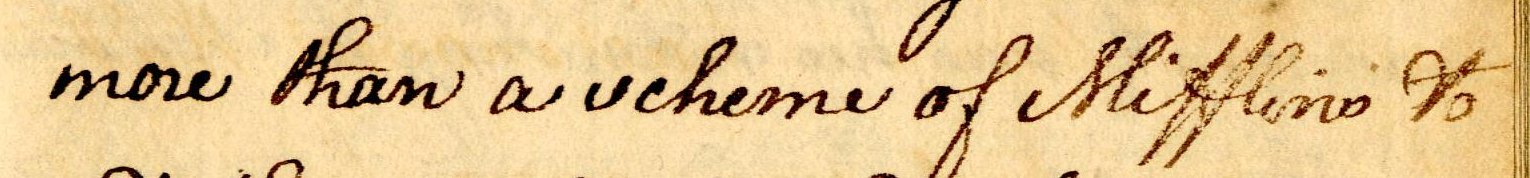more than a scheme of Mifflins ton
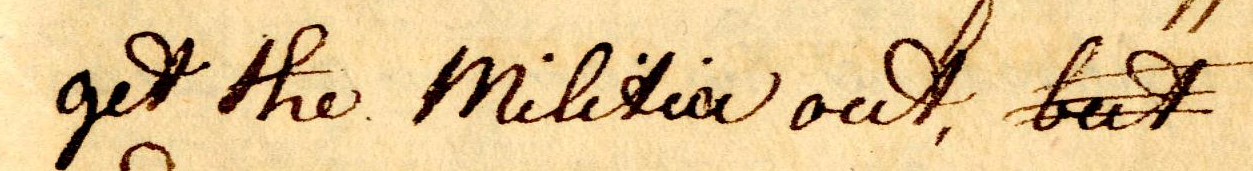get the Militia out, [but]
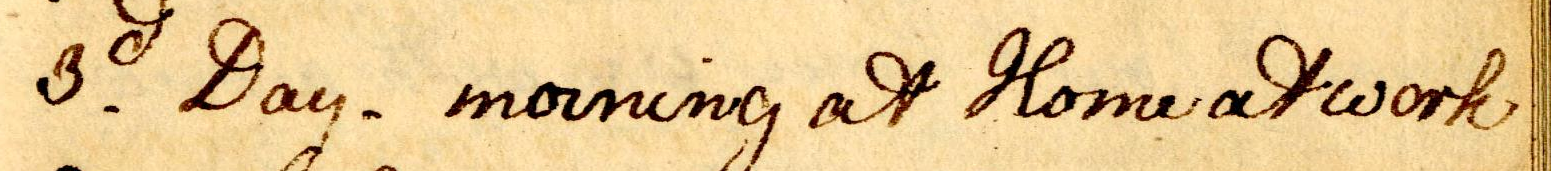3^d. Day. morning at Home at work
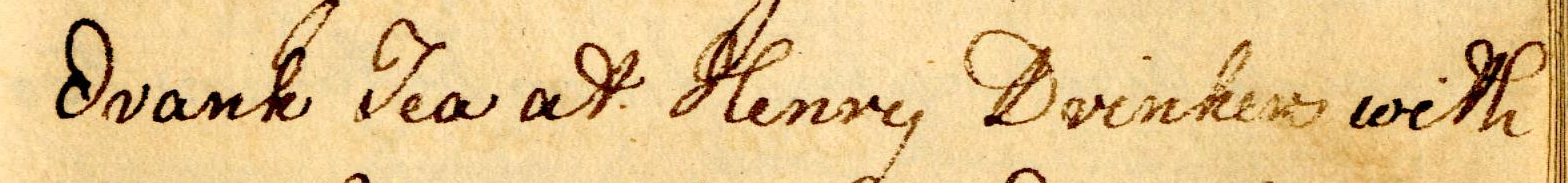drank Tea at Henry Drinkers with
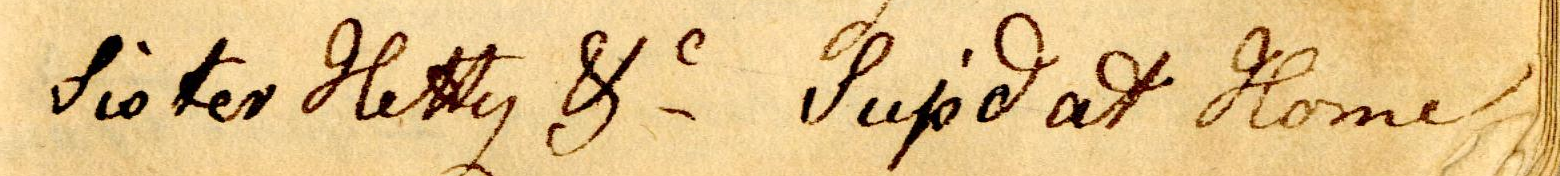Sister Hetty &^c. Sup'd at Home
